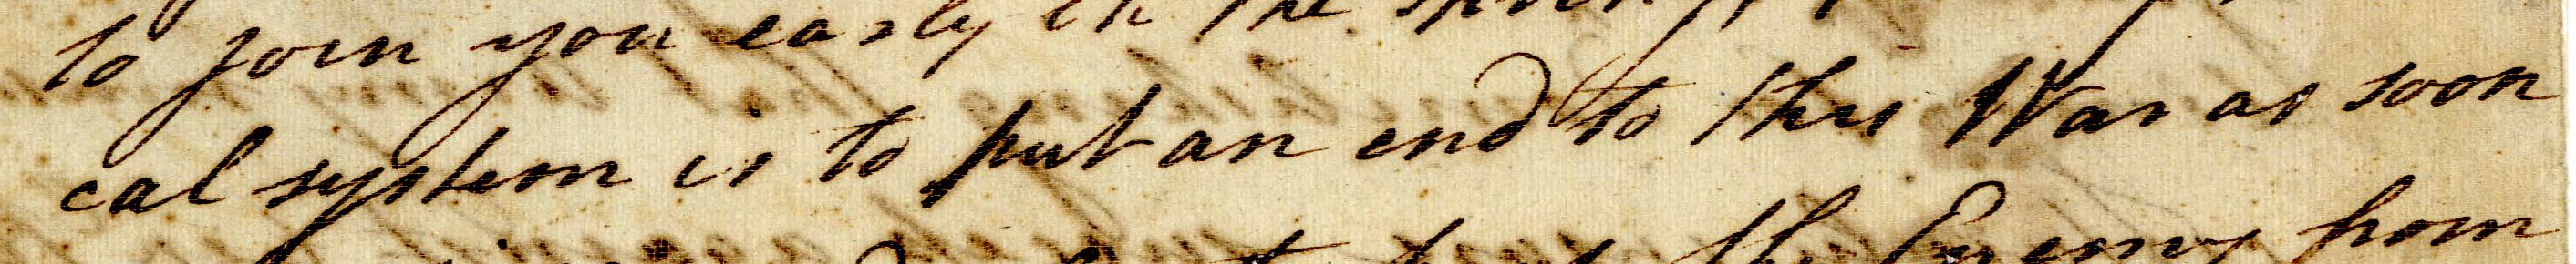cal system is to put an end to this War as soon
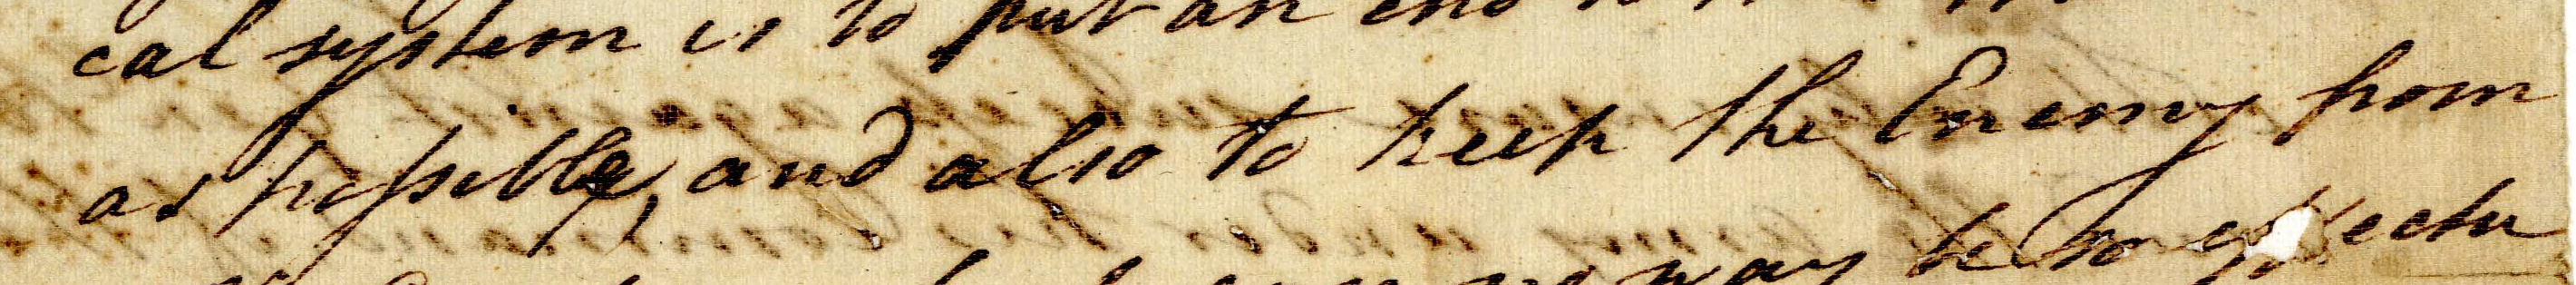as possible, and also to keep the Enemy from
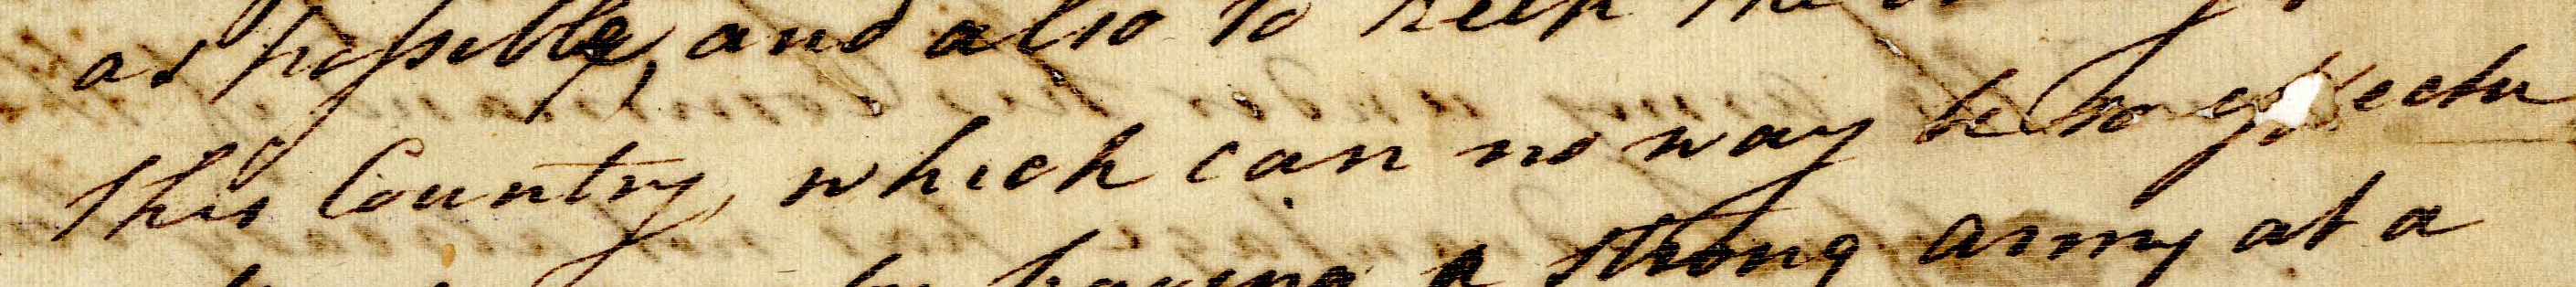this Country, which can no way be so effectu
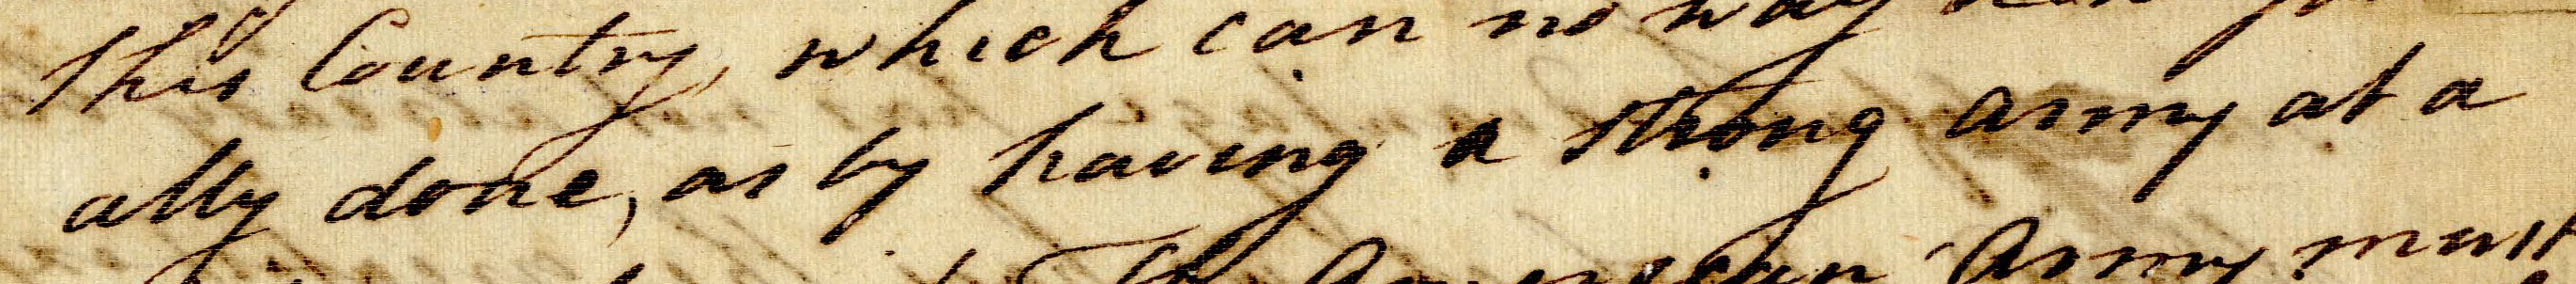ally done, as by having a strong army at a
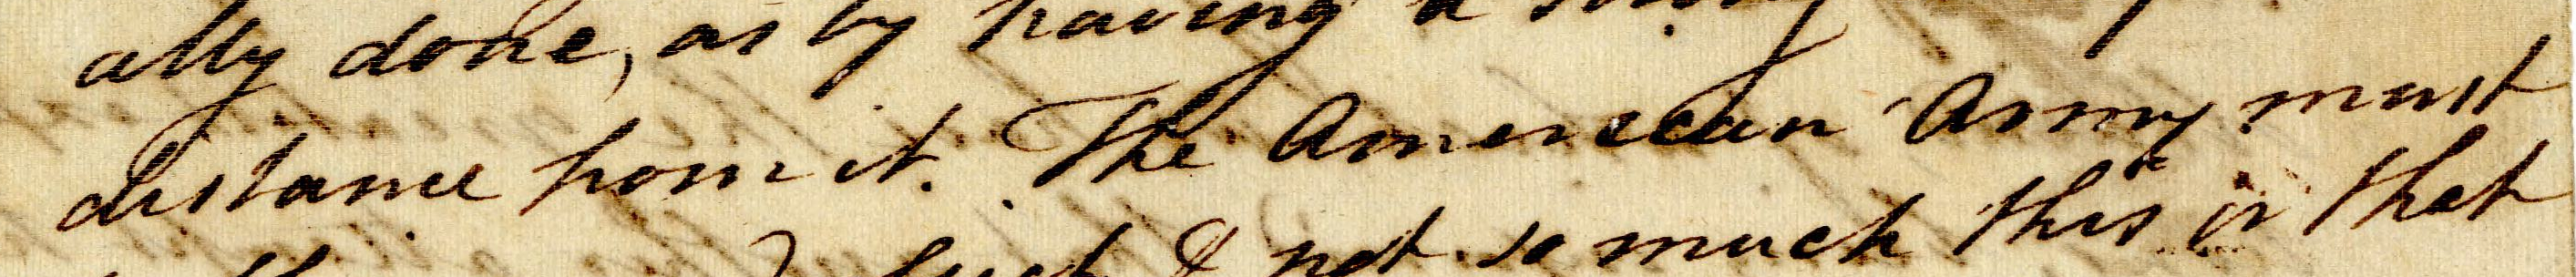distance from it. The American Army must
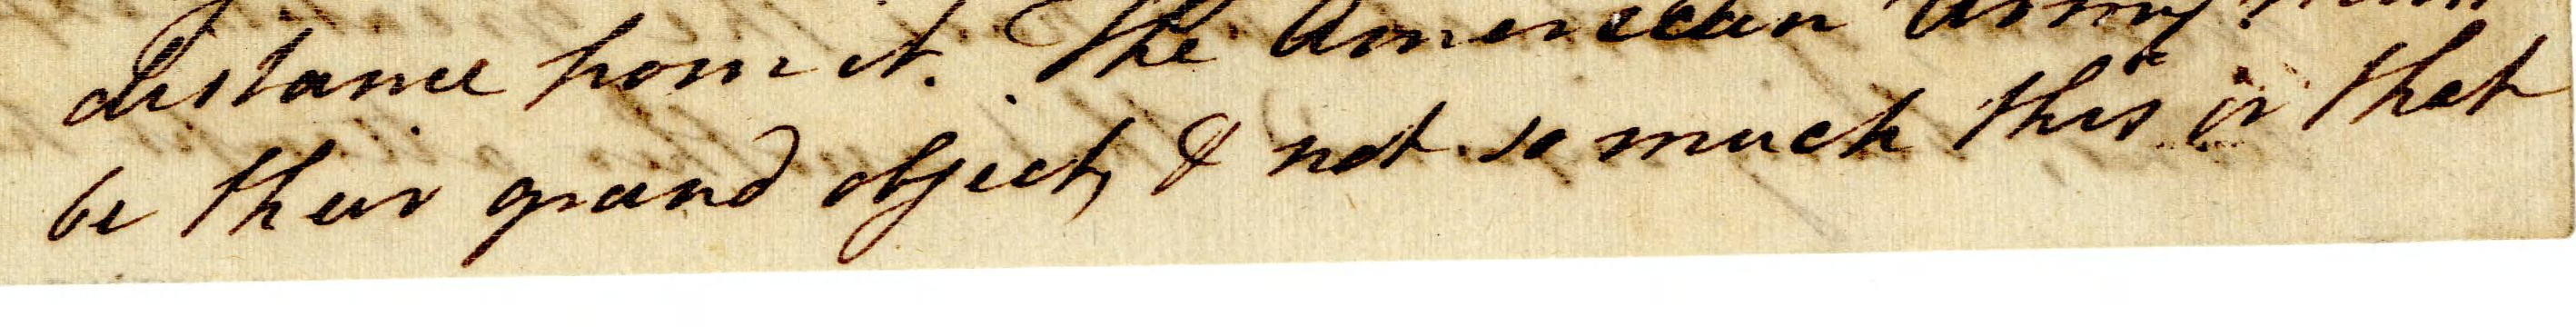be their grand object, & not so much this in that
